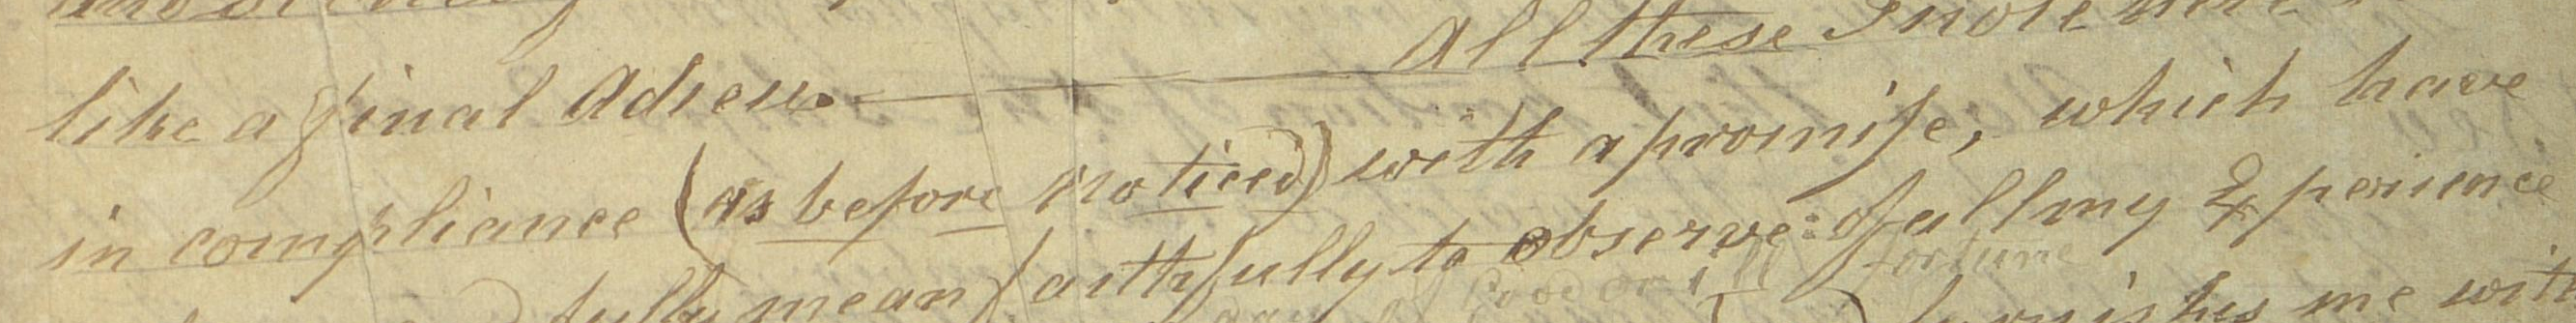in compliance (as before noticed) with a promise, which have
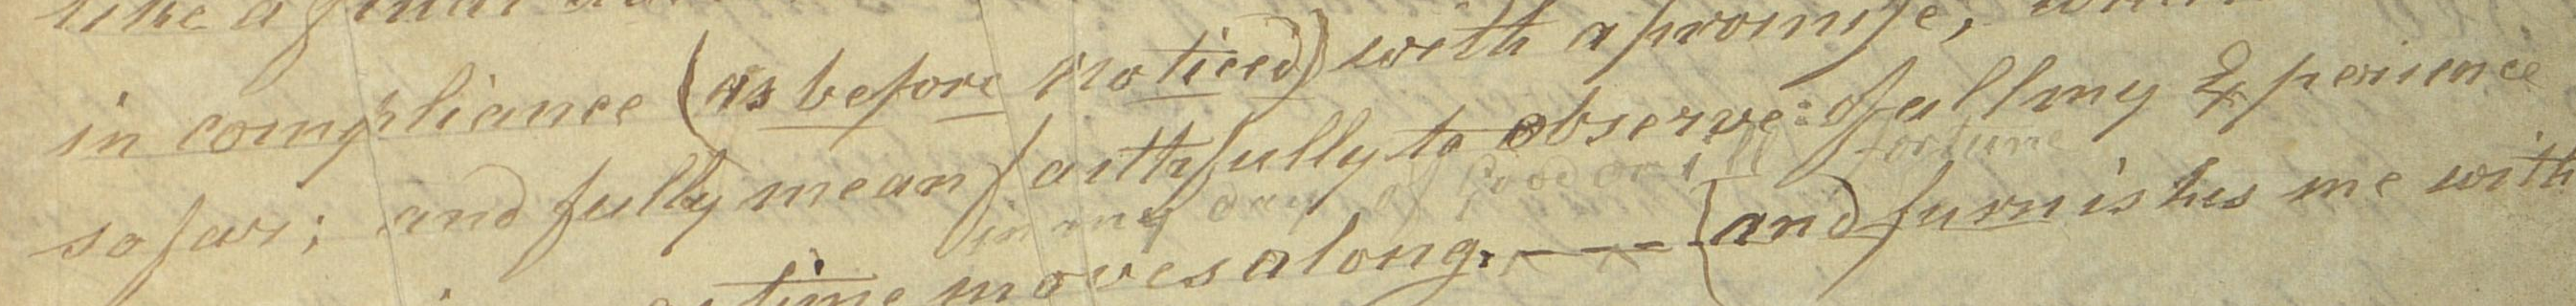so far; and fully mean faithfully to observe: of all my Experience
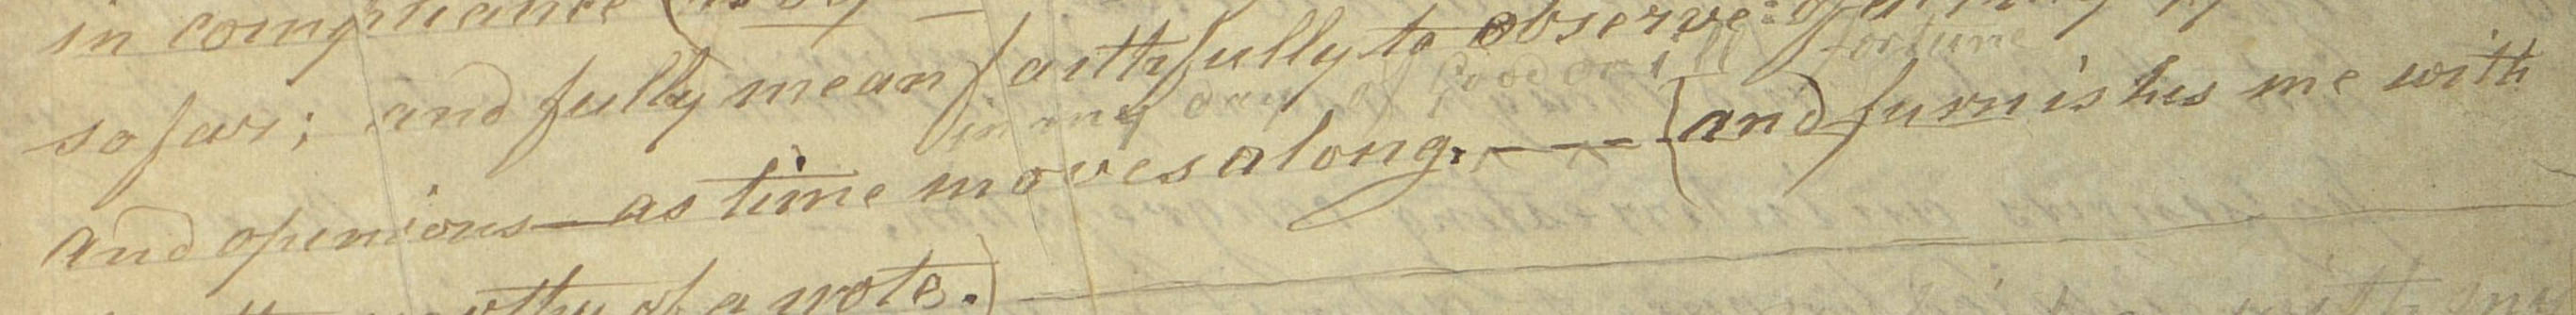and opinions as time moves along. (and furnishes me with
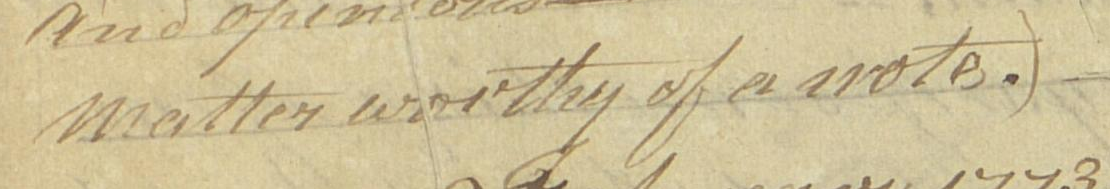matter worthy of a note.)
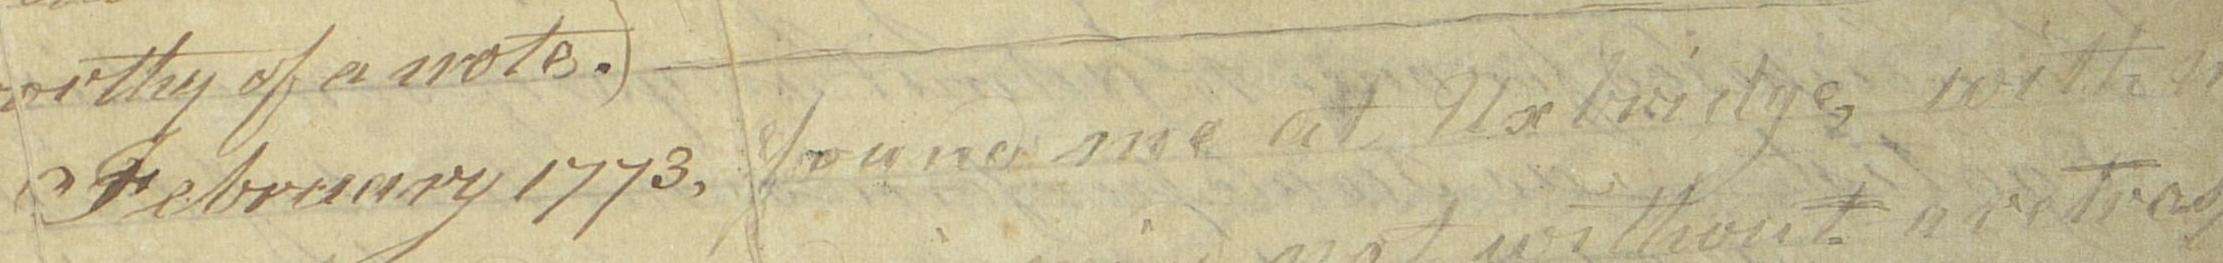February 1773. found me at Uxbridge with any
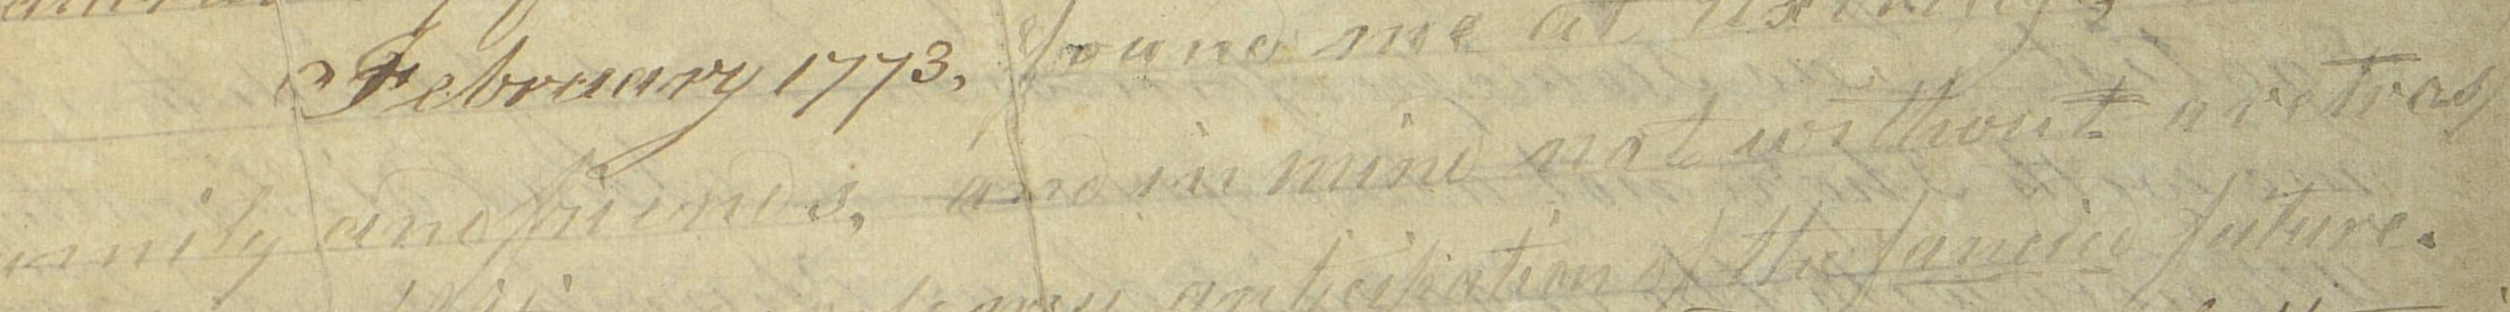family and friends, and in mine not without a retrospe-
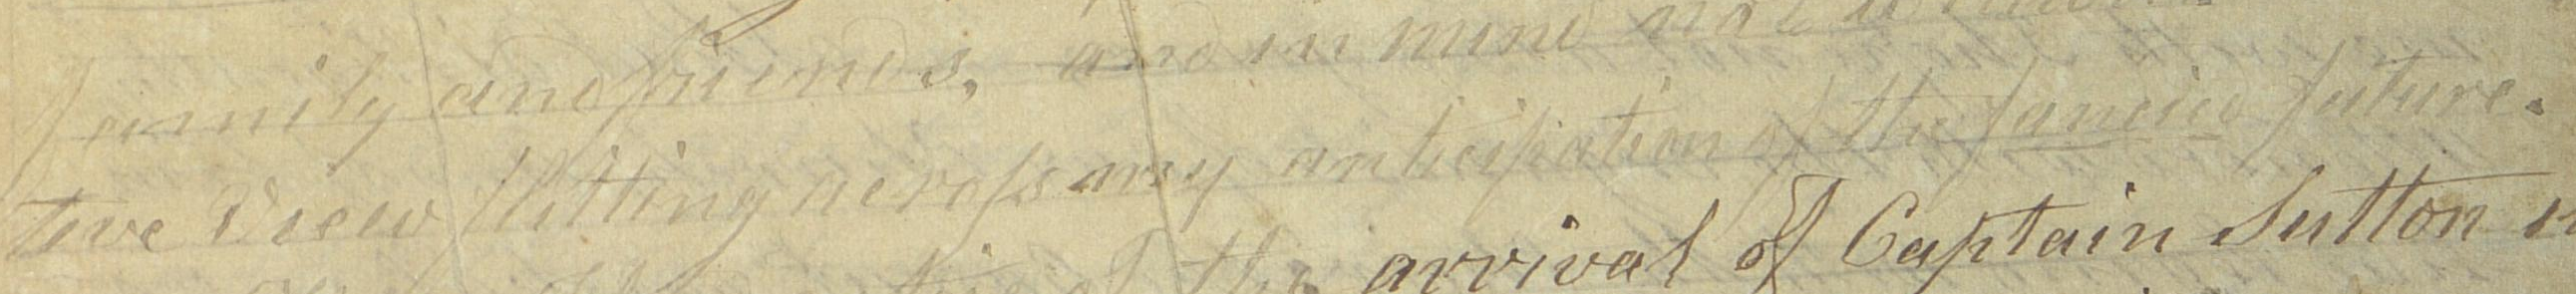-tive view flitting necessary anticipation of the fancied future.
